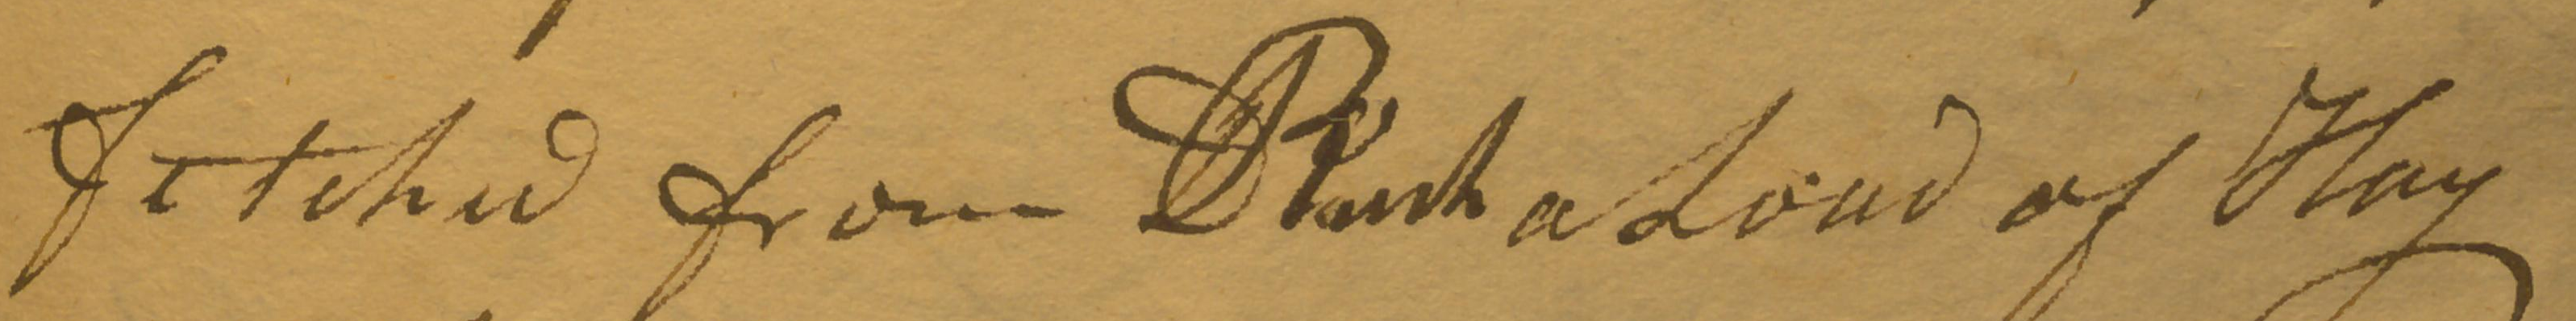fetched from Pluch a Load of Hay
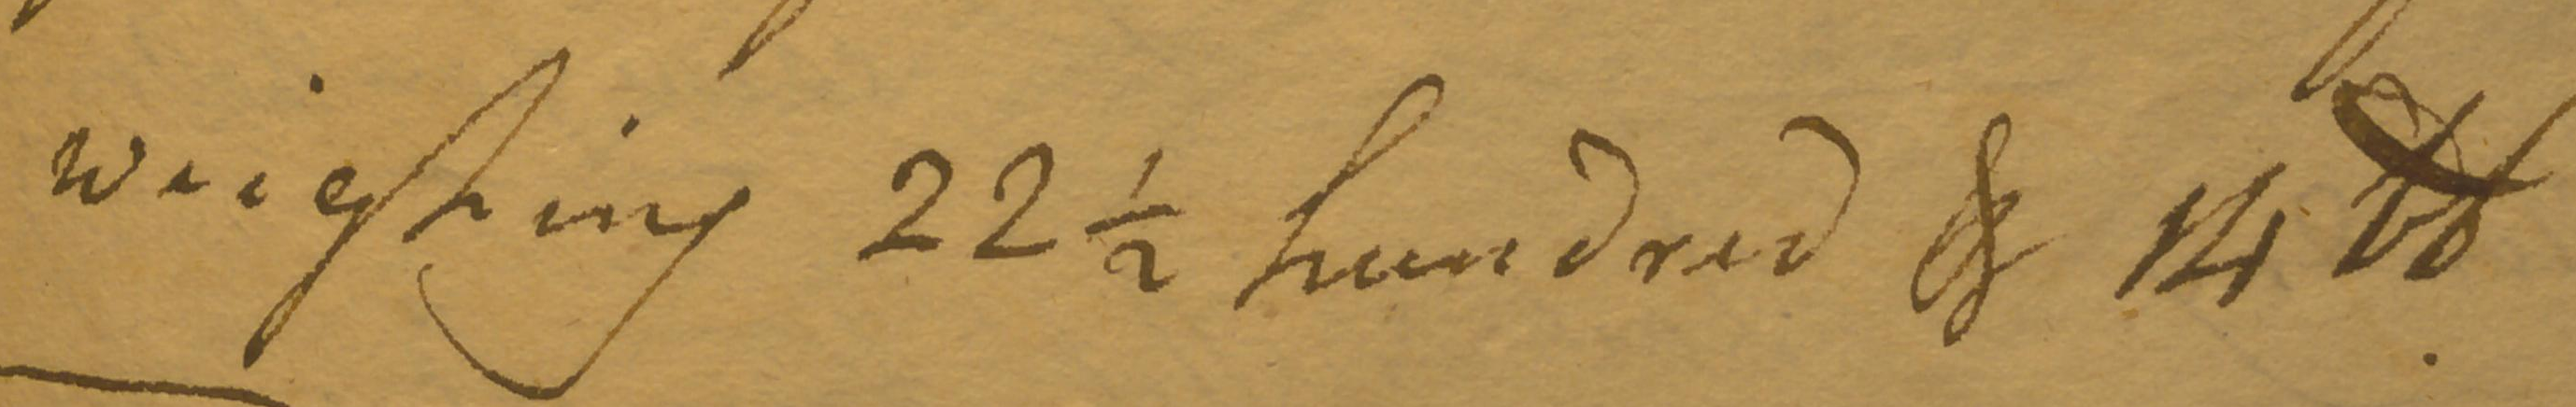deighing 22 1/2 hundred & 14 lb
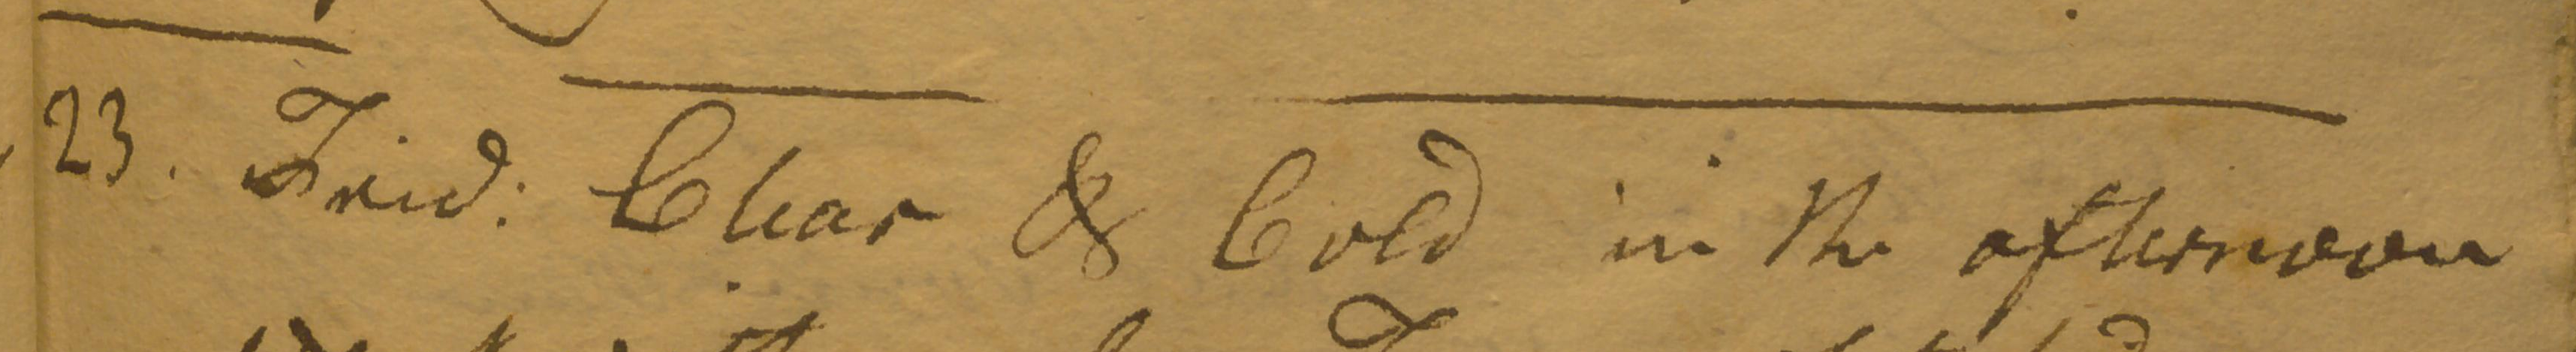23. Frid. Clear & Cold in the afternoon
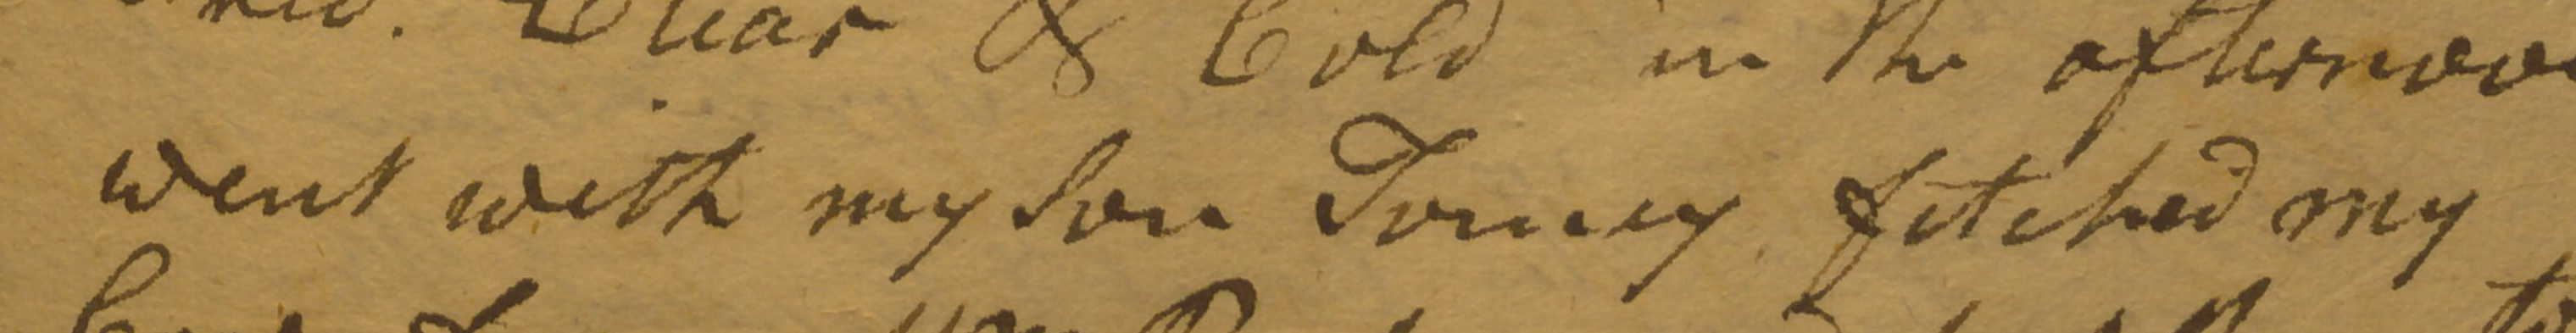went with my son Tomey fetched my
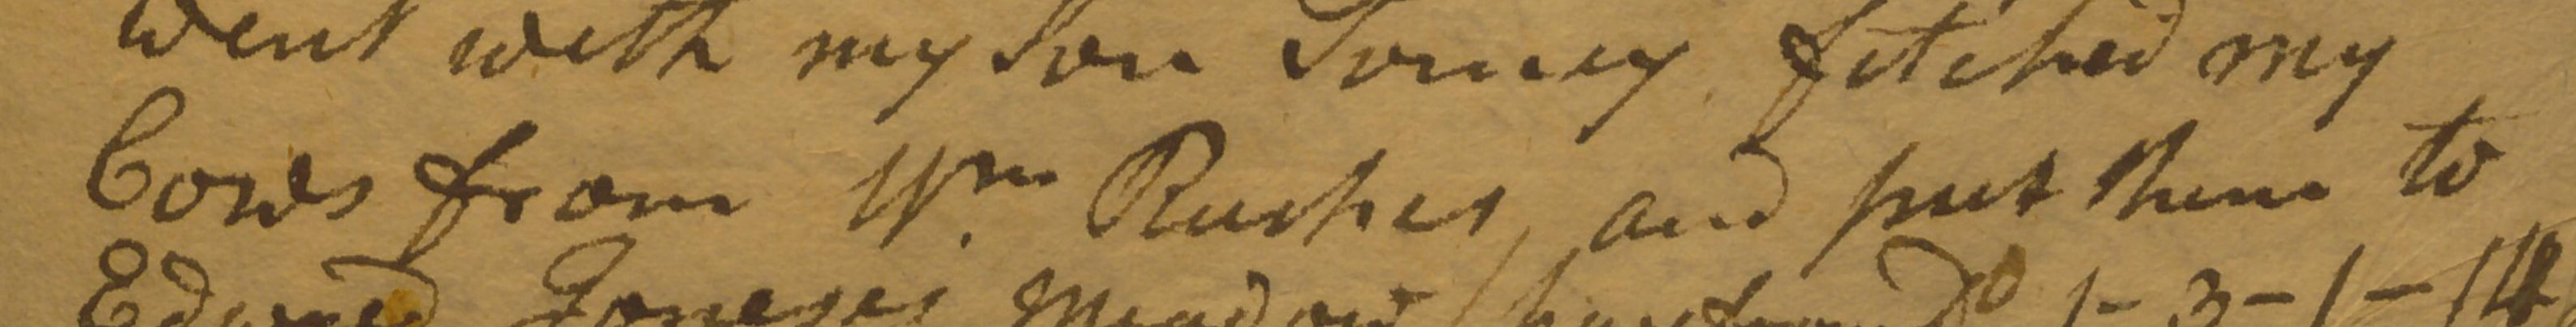Cows from W^m Rushes, and put them to
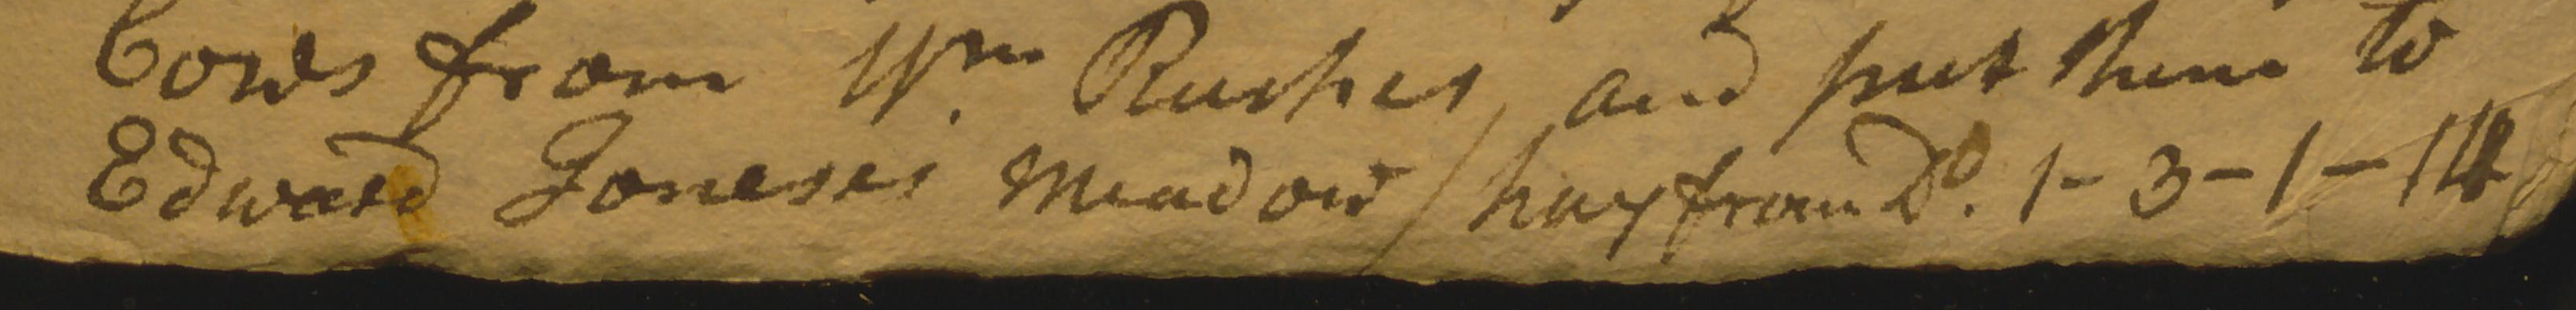Edward Joneses meadow hay from D^o. 1-3-1-14
